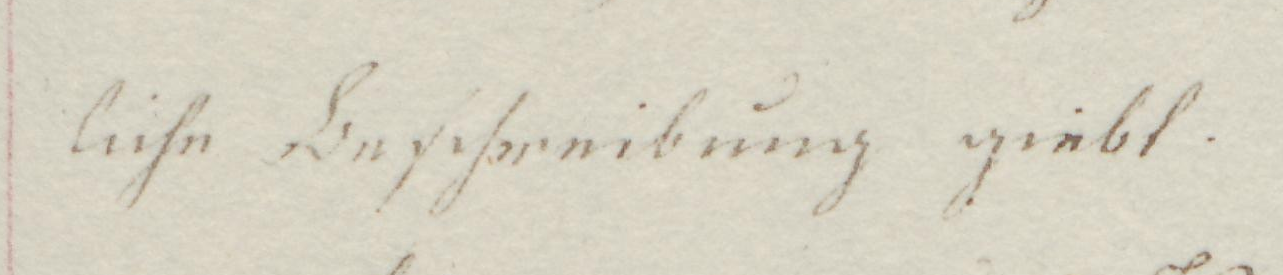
liche Beschreibung giebt.
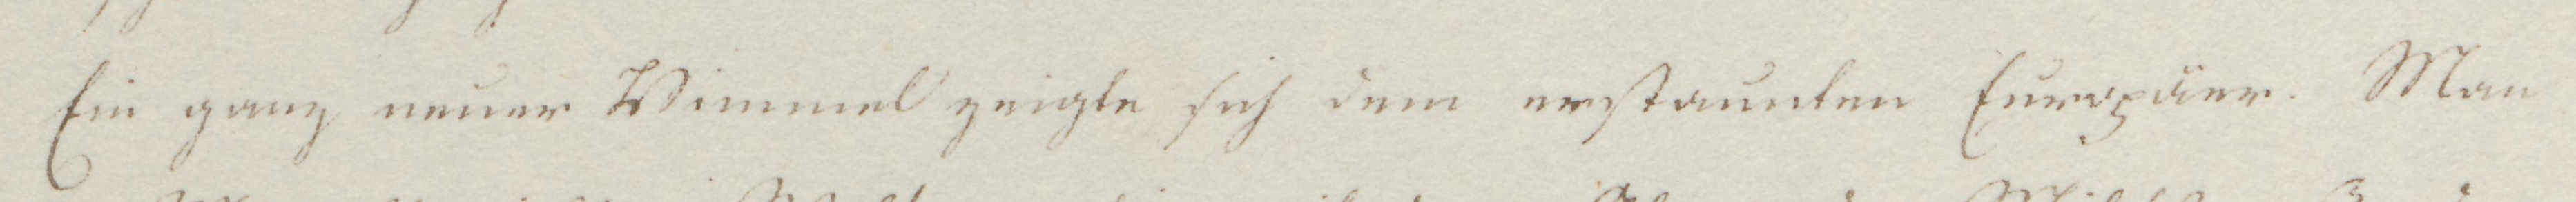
Ein ganz neuer Himmel zeigte sich dem erstaunten Europäer. Man
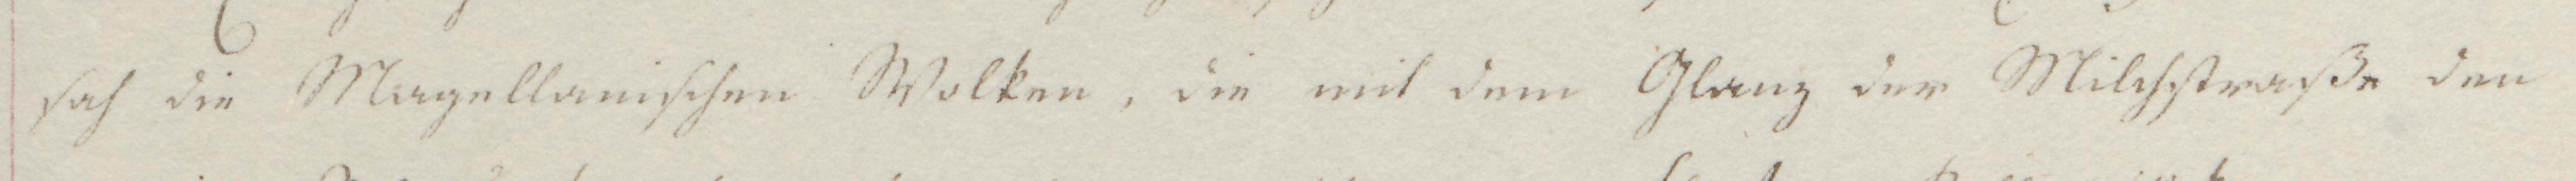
sah die Magellanischen Wolken, die mit dem Glanz der Milchstraße den
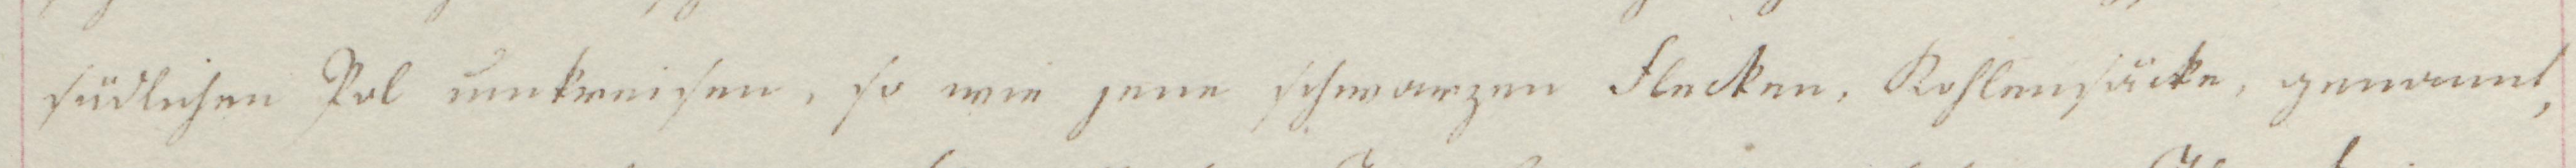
südlichen Pol umkreisen, so wie jene schwarzen Flecken, Kohlensäcke, genannt,
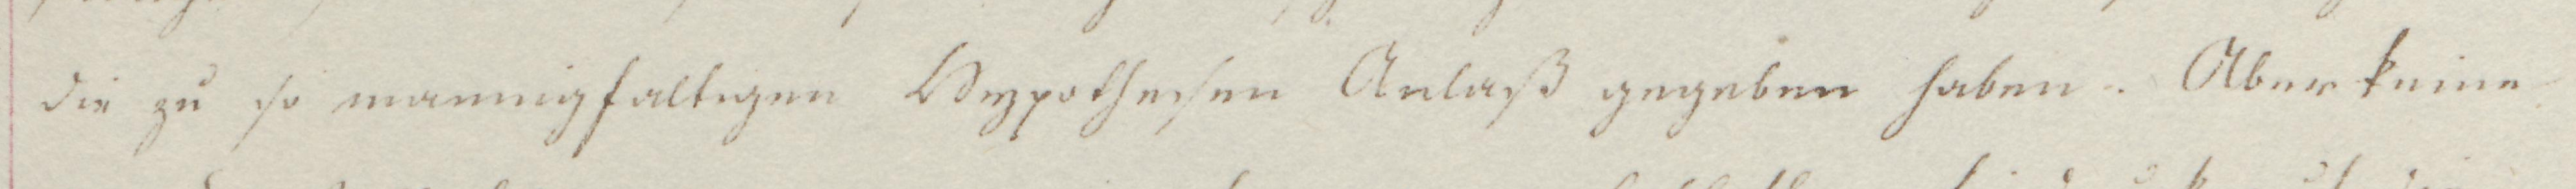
die zu so mannigfaltigen Hypothesen Anlaß gegeben haben. Aber keine
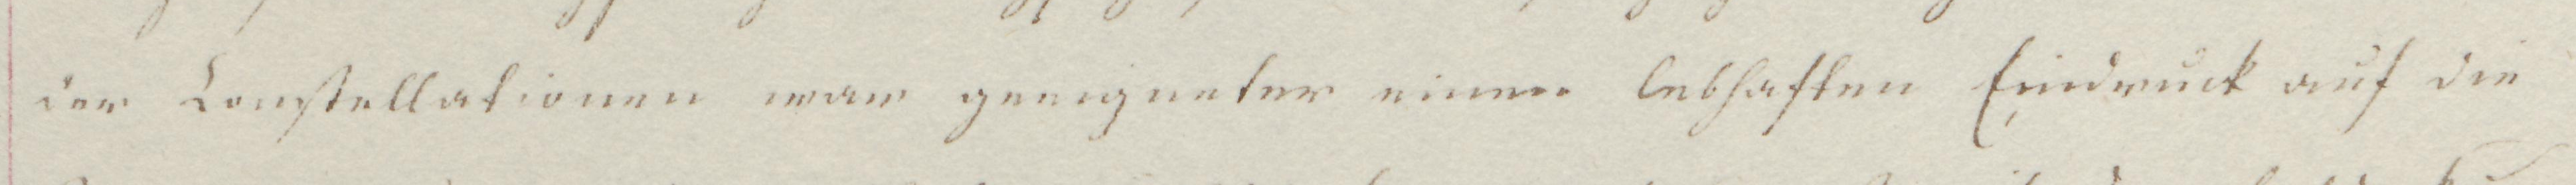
der Constellationen war geeigneter einen lebhaften Eindruck auf die
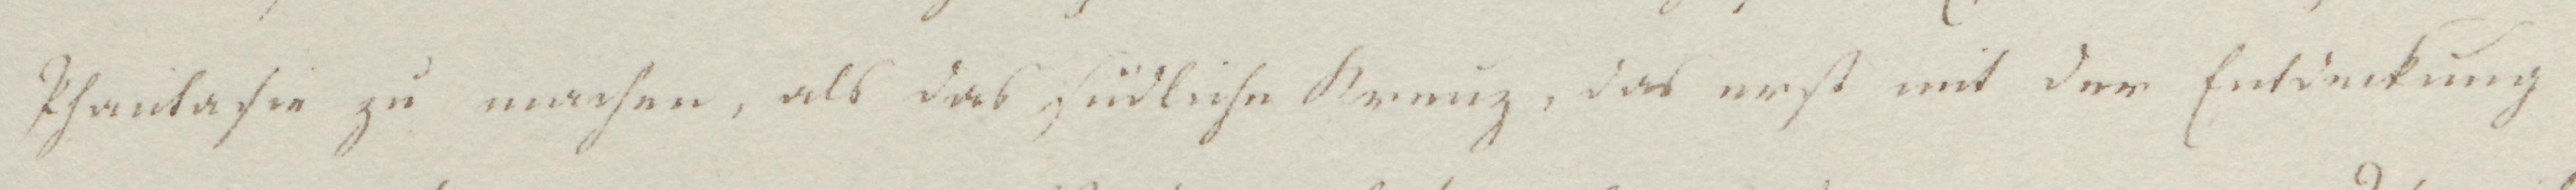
Phantasie zu machen, als das südliche Kreuz, das erst mit der Entdeckung
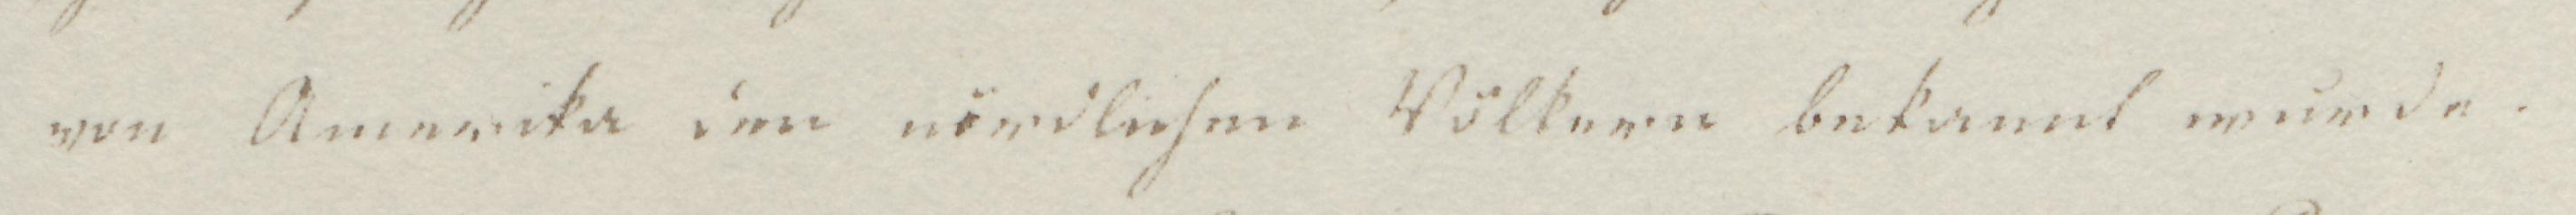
von Amerika den nördlichen Völkern bekannt wurde. –
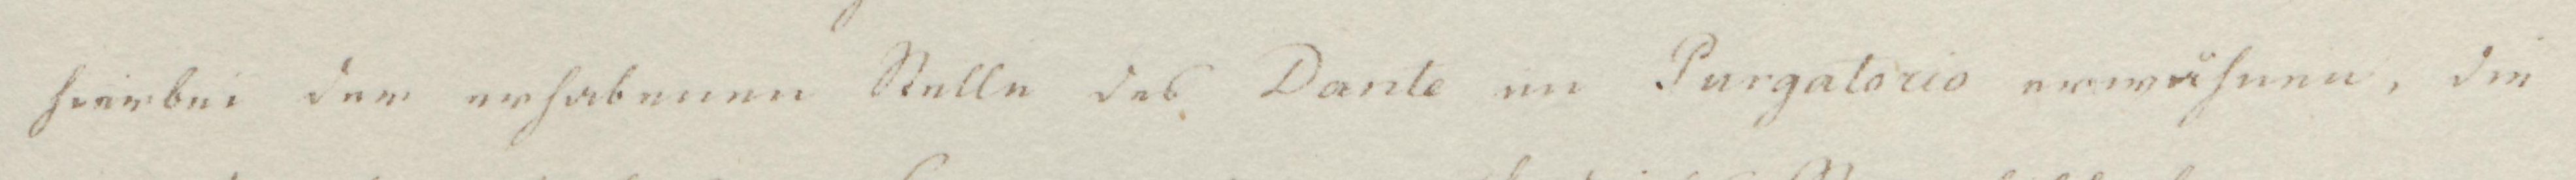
hierbei der erhabenen Stelle des Dante im Purgatorio erwähnen, die
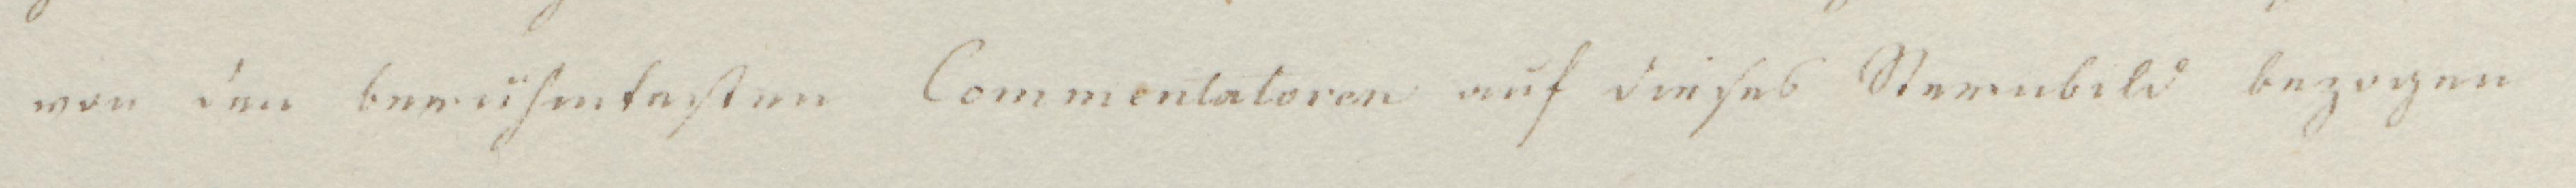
von den berühmtesten Commentatoren auf dieses Sternbild bezogen
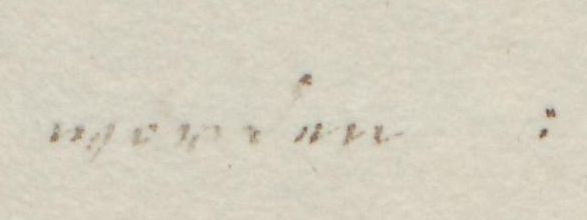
wogegen Pet. Mart. de
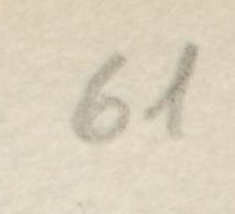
beson-
